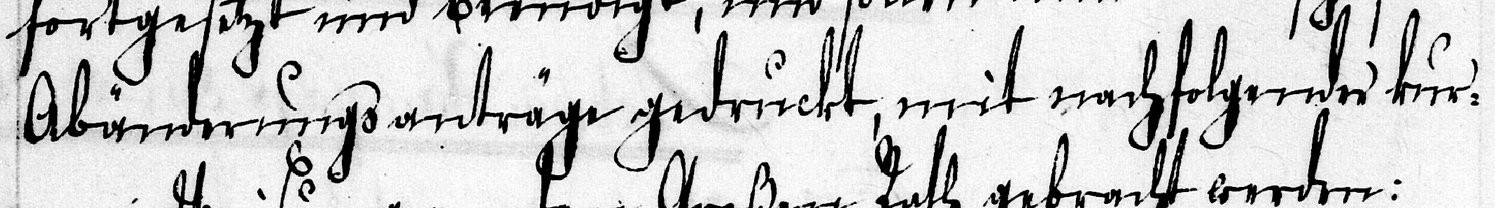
Abänderungsanträge gedruckt, mit nachfolgender kur¬
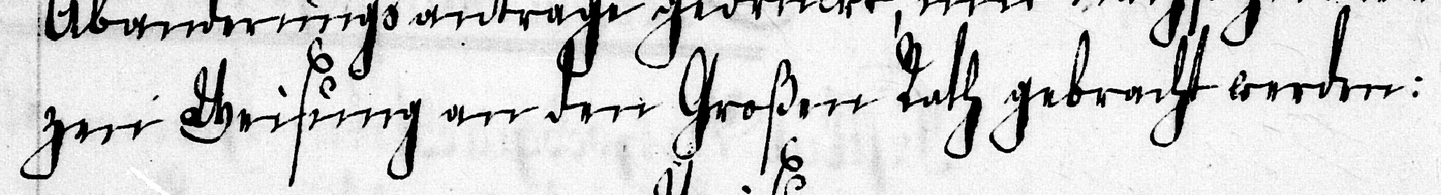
zen Weisung an den Großen Rath gebracht werden:
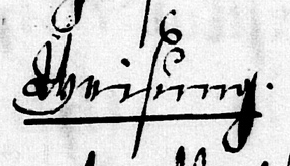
Weisung:
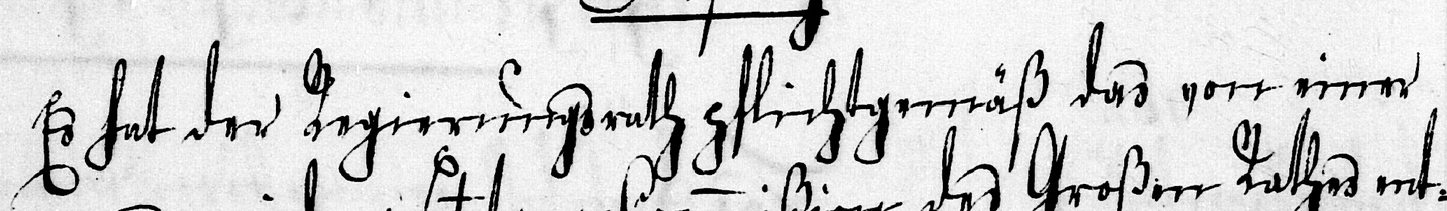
Es hat der Regierungsrath pflichtgemäß das von einer
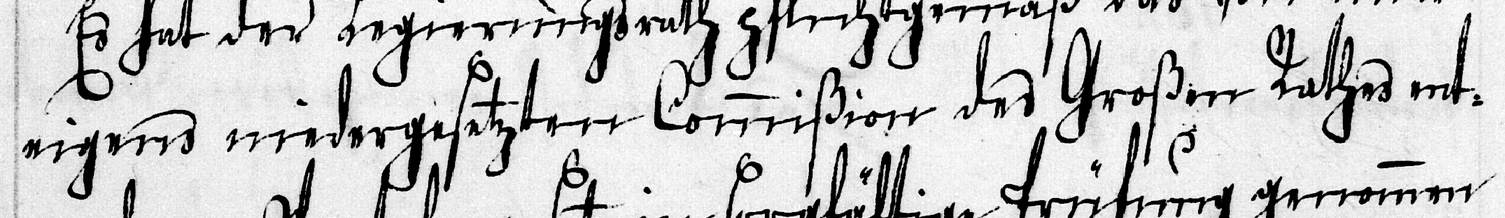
eigens niedergesetzten Commißion des Großen Rathes ent¬
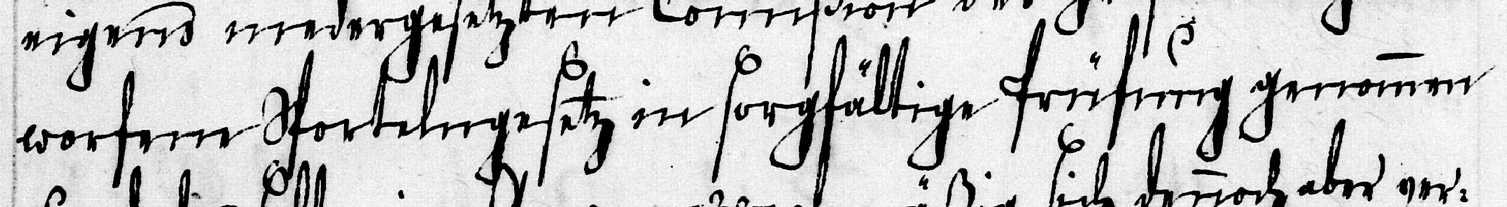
worfene Sportelngesetz in sorgfältige Prüfung genommen
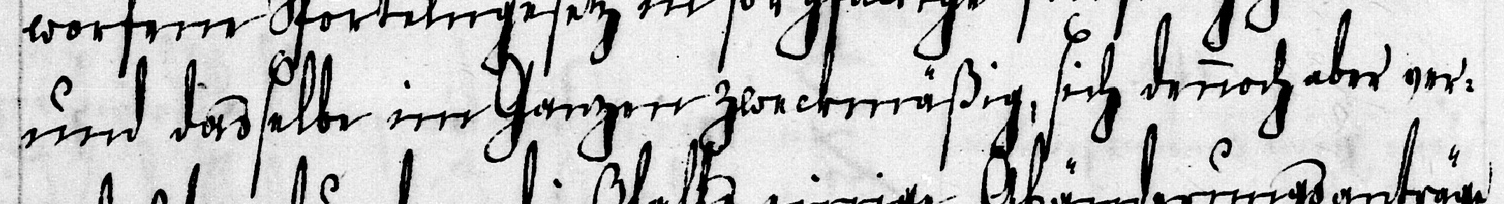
und dasselbe im Ganzen zweckmäßig, sich dennoch aber ver¬
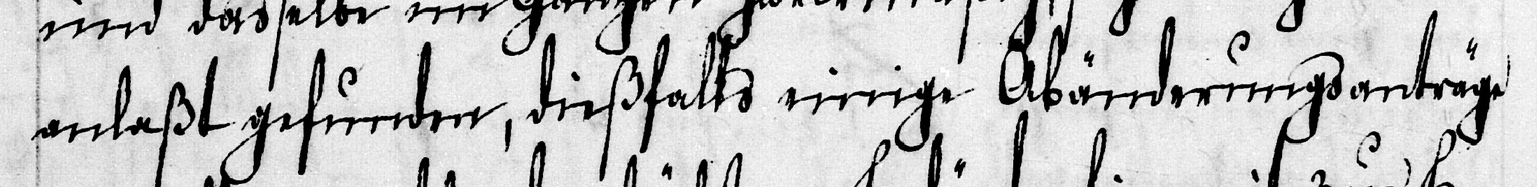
anlaßt gefunden, dießfalls einige Abänderungsanträge
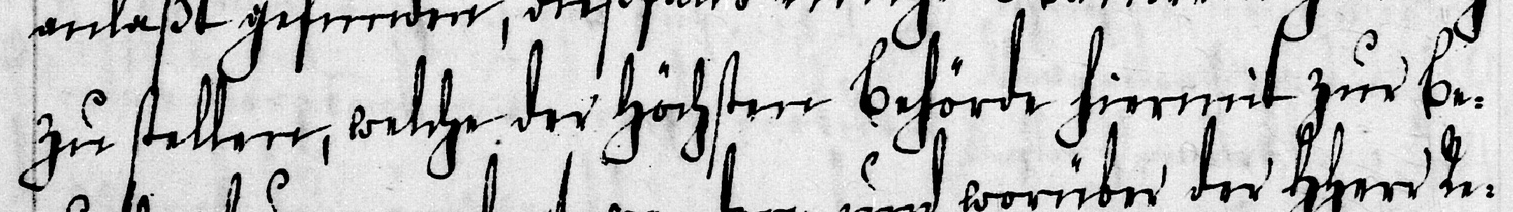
zu stellen, welche der Höchsten Behörde hiermit zur Be¬
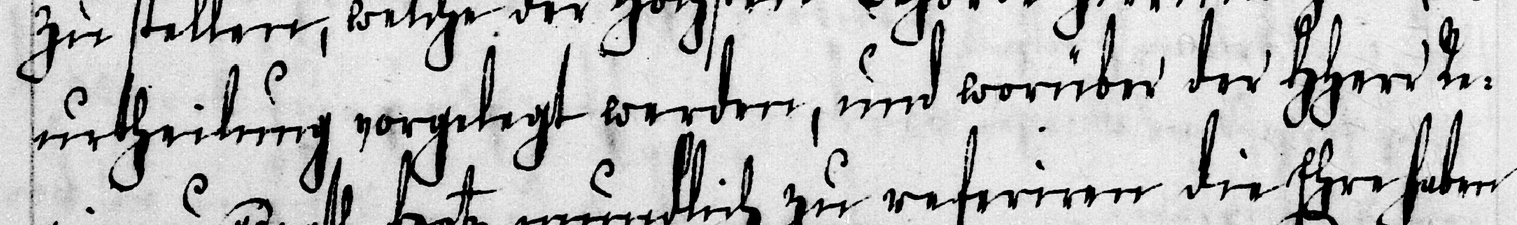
urtheilung vorgelegt werden, und worüber der HHerr Re¬
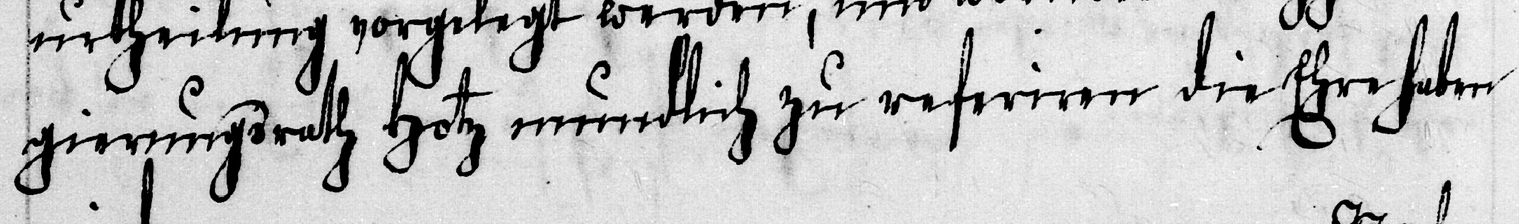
gierungsrath Hotz mundlich zu referiren die Ehre haben
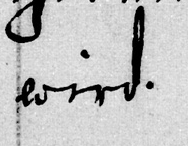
wird.
